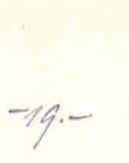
19.
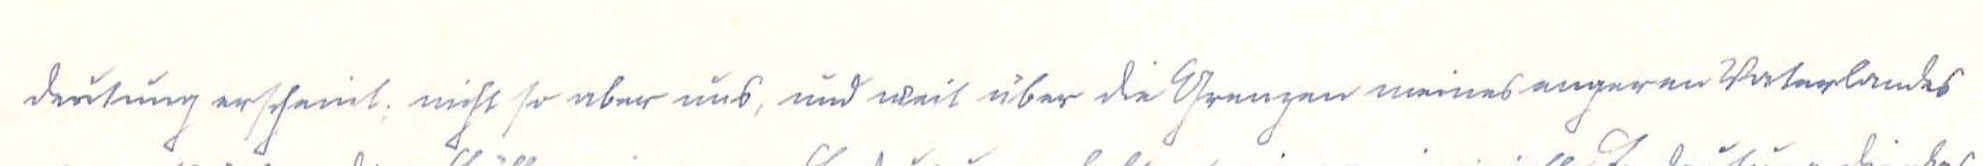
deutung erscheint, nicht so aber uns und weit über die Grenzen meines engeren Vaterlands
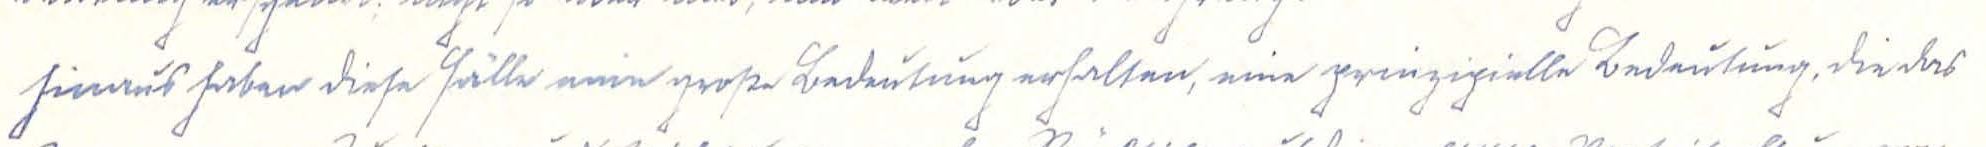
hinaus haben diese Fälle eine große Bedeutung erhalten, eine prinzipielle Bedeutung, die das
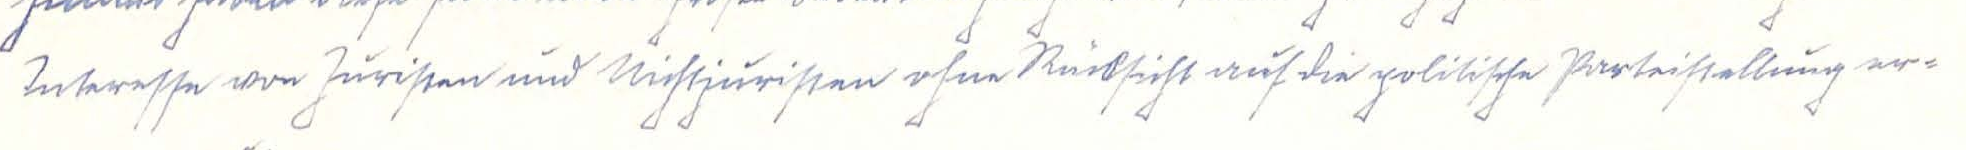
Interesse von Juristen und Nichtjuristen ohne Rücksicht auf die politische Parteistellung er-
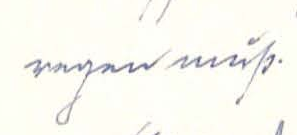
regen muß.
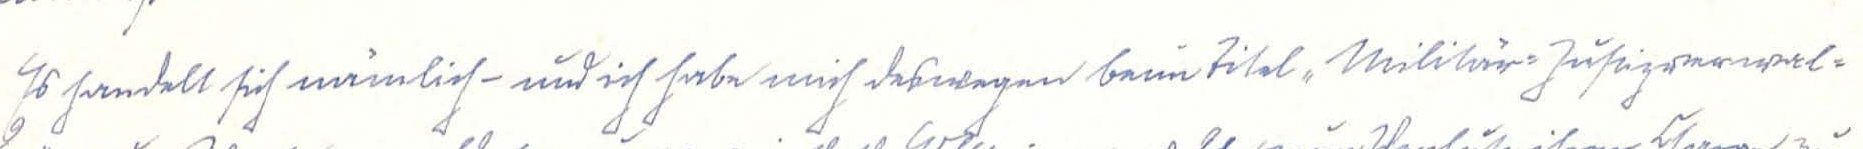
Es handelt sich nämlich - und ich habe mich deswegen beim Titel "Militär - Justizverwal-
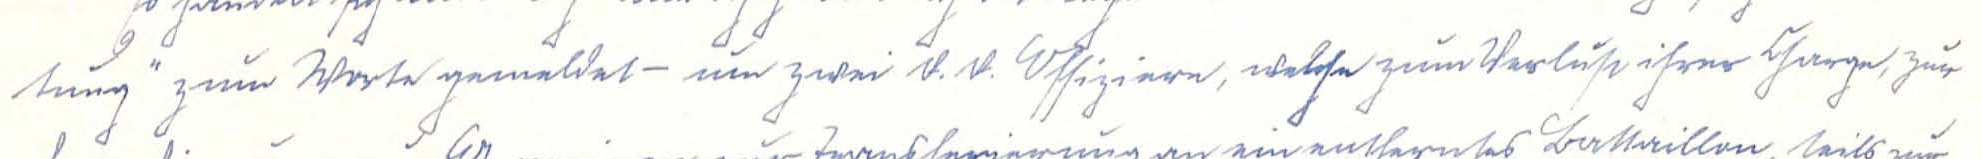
tung" zum Worte gemeldet- um zwei k. k. Offiziere, welche zum Verlust ihrer Charge, zur
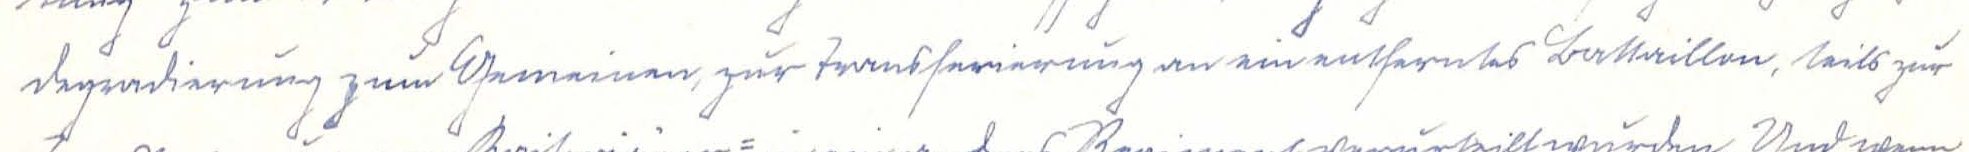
degradierung zum Gemeinen, zur Transferierung an ein entferntes Battaillon, teils zur
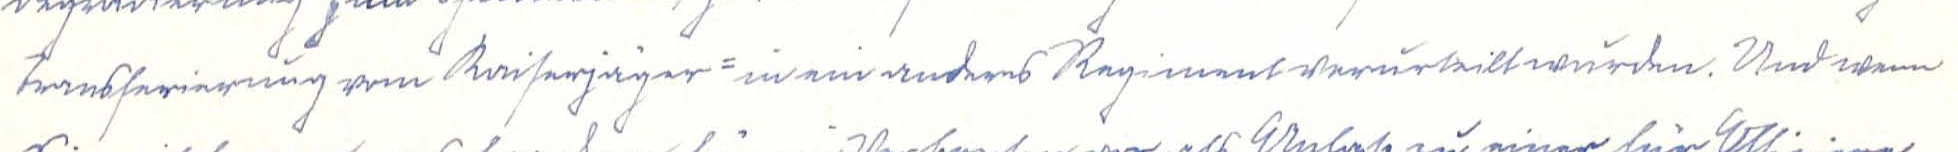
Transferierung vom Kaiserjäger - in ein anderes Regiment verurteilt wurden. Und wenn
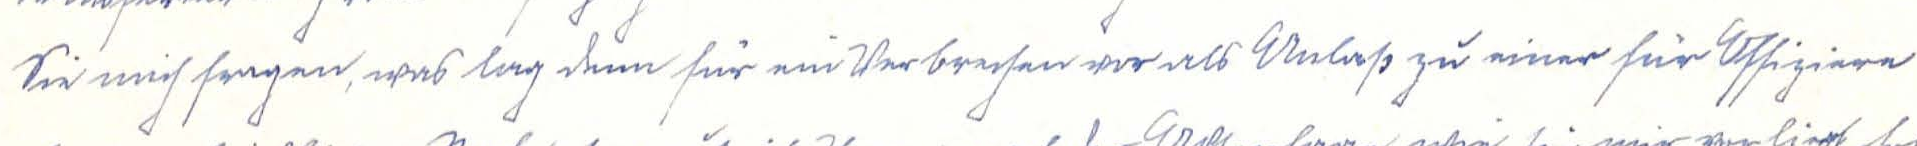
sie mich fragen, was lag dem für ein Verbrechen vor als Anlaß zu einer für Offiziere
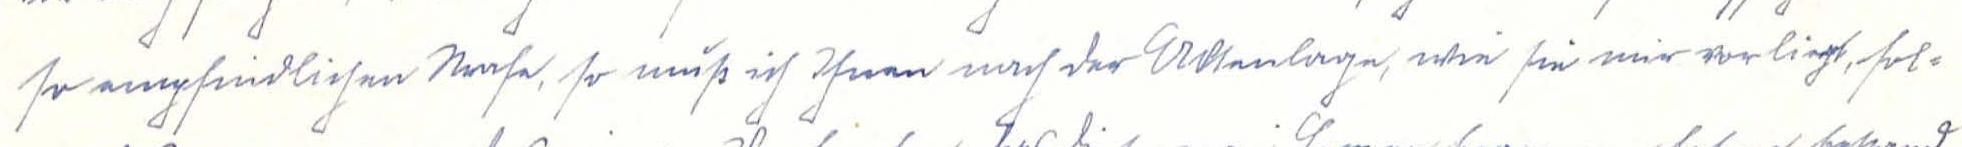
so empfindlichen Strafe, so muß ich Ihnen nach der Aktenlage, wie sie mir vorliegt, fol
